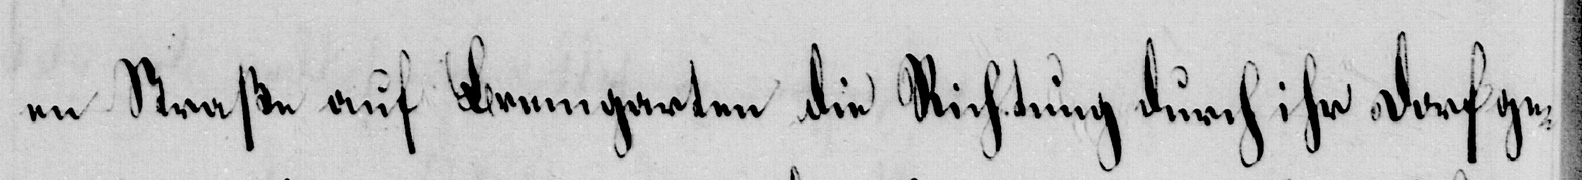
en Straße auf Bremgarten die Richtung durch ihr Dorf ge¬
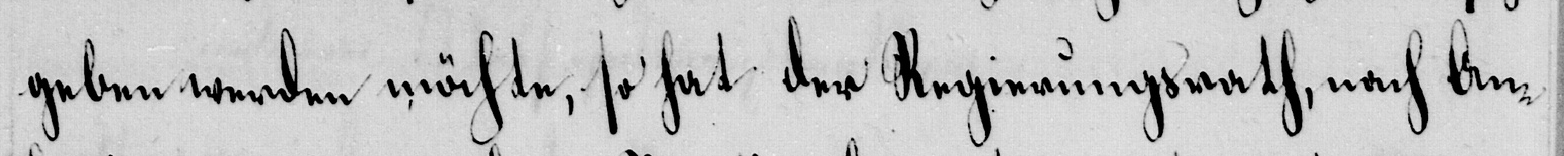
geben werden möchte, so hat der Regierungsrath, nach An¬
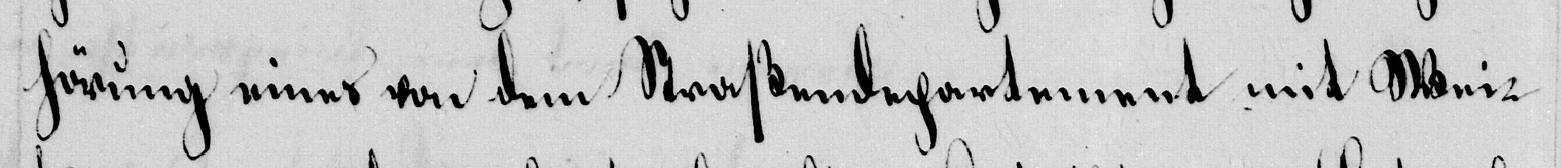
hörung eines von dem Straßendepartement mit Wei¬
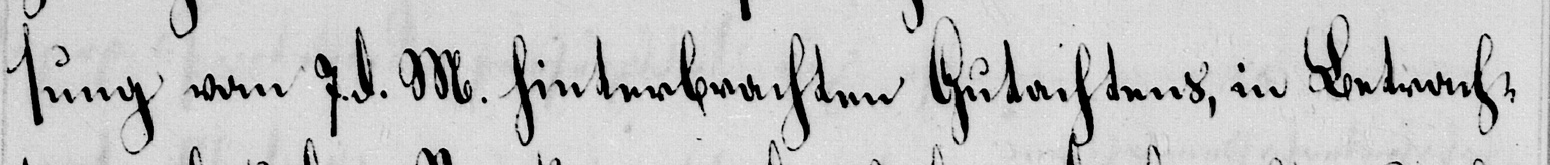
sung vom 7. d. M. hinterbrachten Gutachtens, in Betrach¬
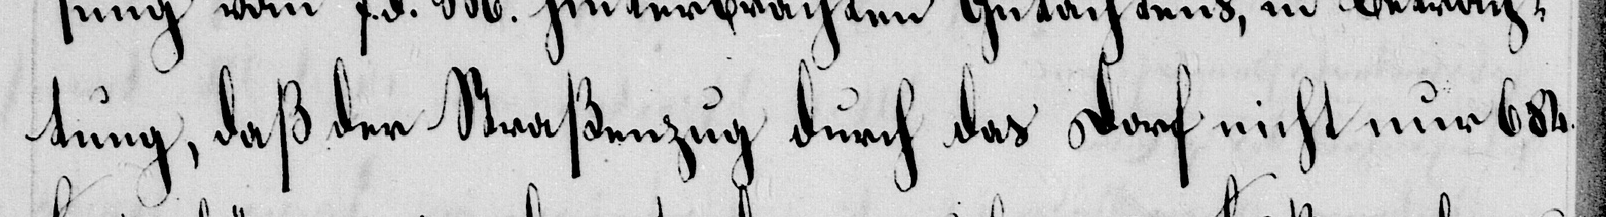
tung, daß der Straßenzug durch das Dorf nicht nur 684.
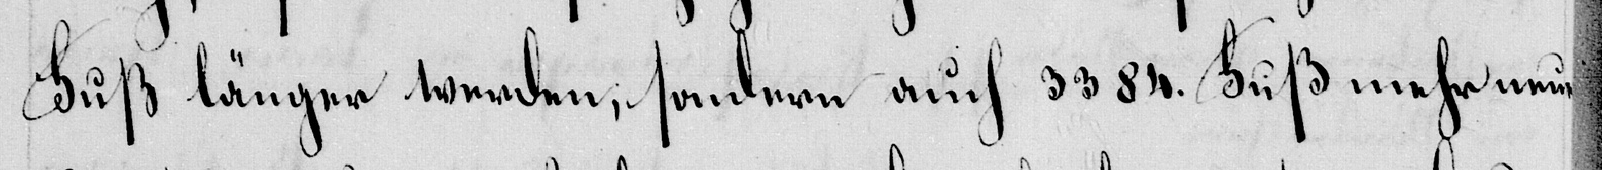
Fuß länger werden, sondern auch 3384. Fuß mehr neue
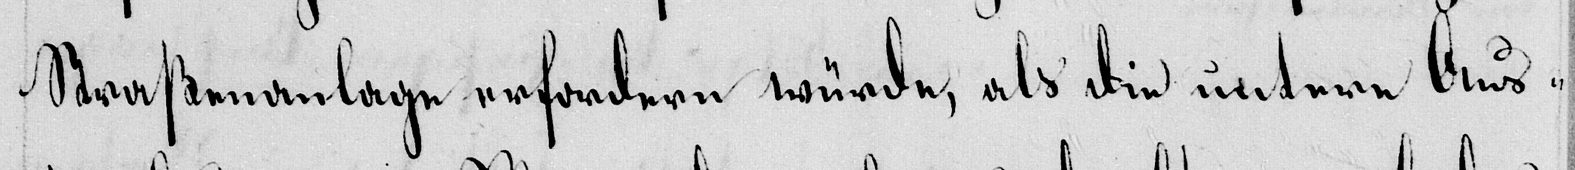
Straßenanlage erfordern würde, als die untere Aus¬
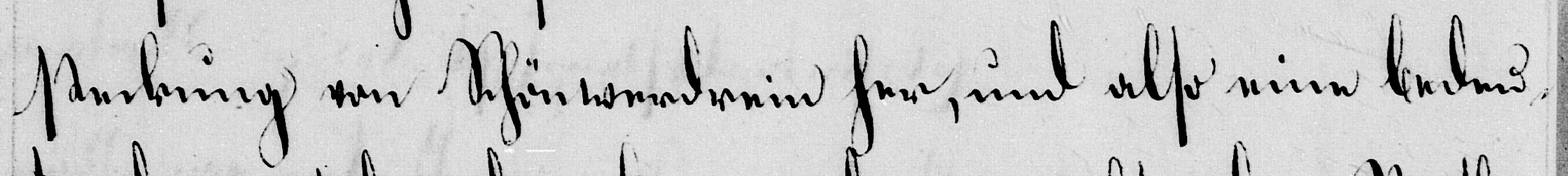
steckung von Schönwerdrein her, und also eine bedeu¬
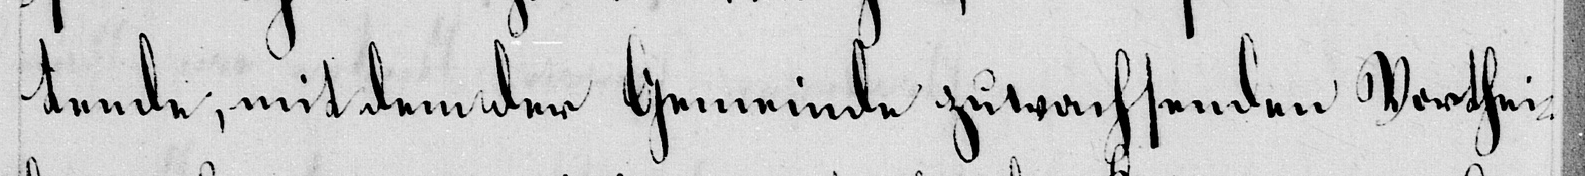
tende, mit dem der Gemeinde zuwachsenden Vorthei¬
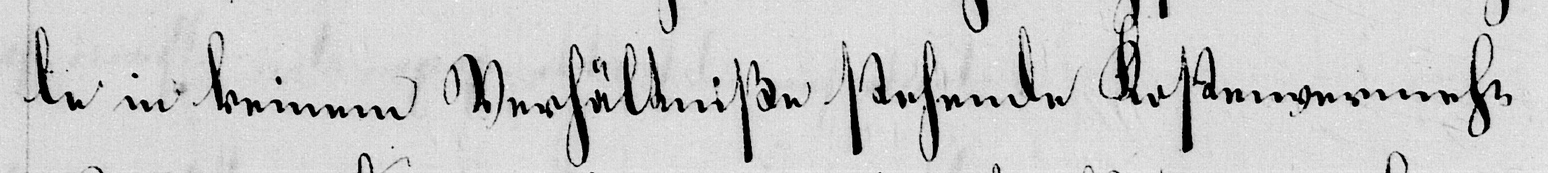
le in keinem Verhältniße stehende Kostenvermeh¬
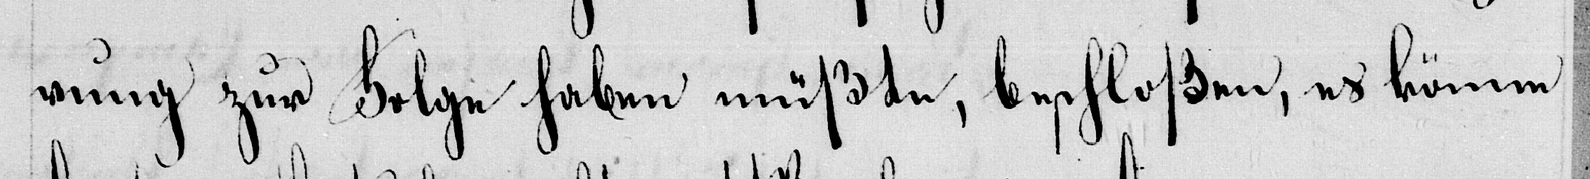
rung zur Folge haben müßte, beschloßen, es könne
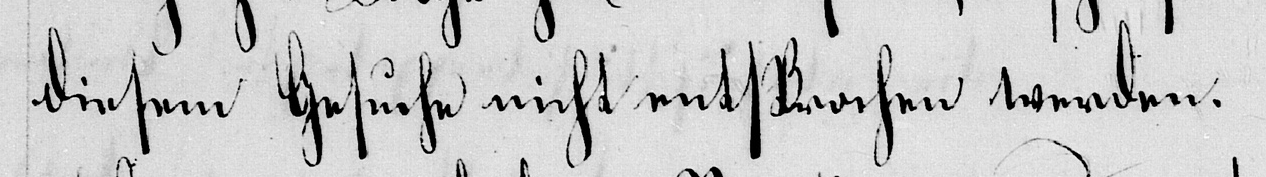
diesem Gesuche nicht entsprochen werden.
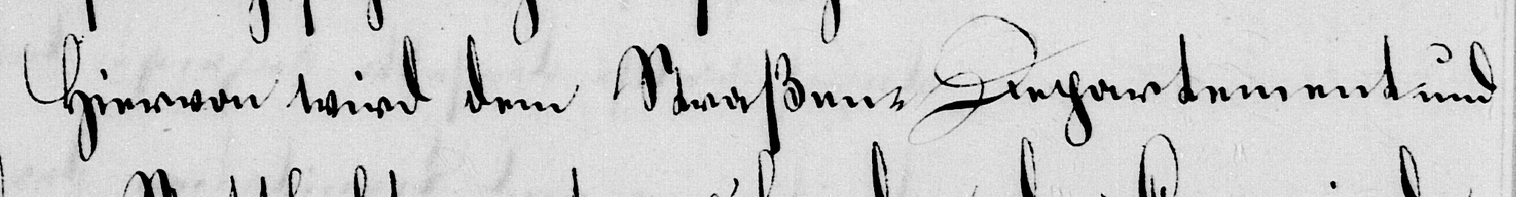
Hiervon wird dem Straßen-Departement und
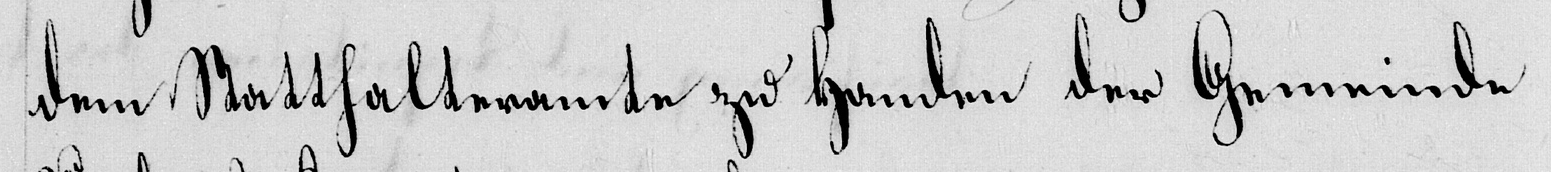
dem Statthalteramte zu Handen der Gemeinde
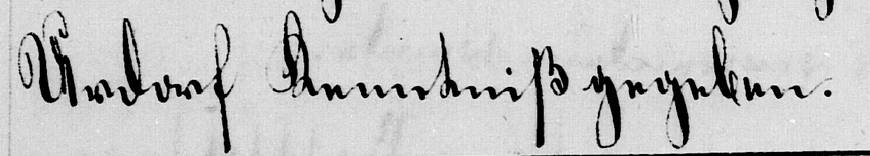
Urdorf Kenntniß gegeben.
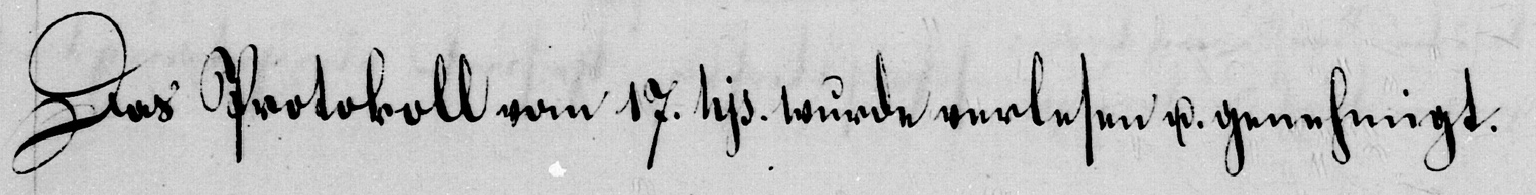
Das Protokoll vom 17. hjs. wurde verlesen u. genehmigt.
